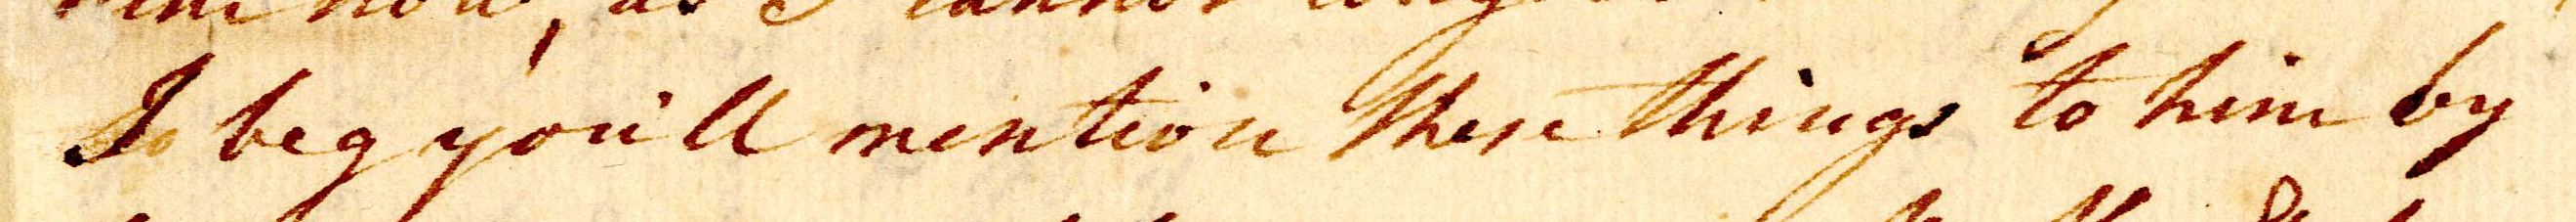I beg you'll mention these things to him by
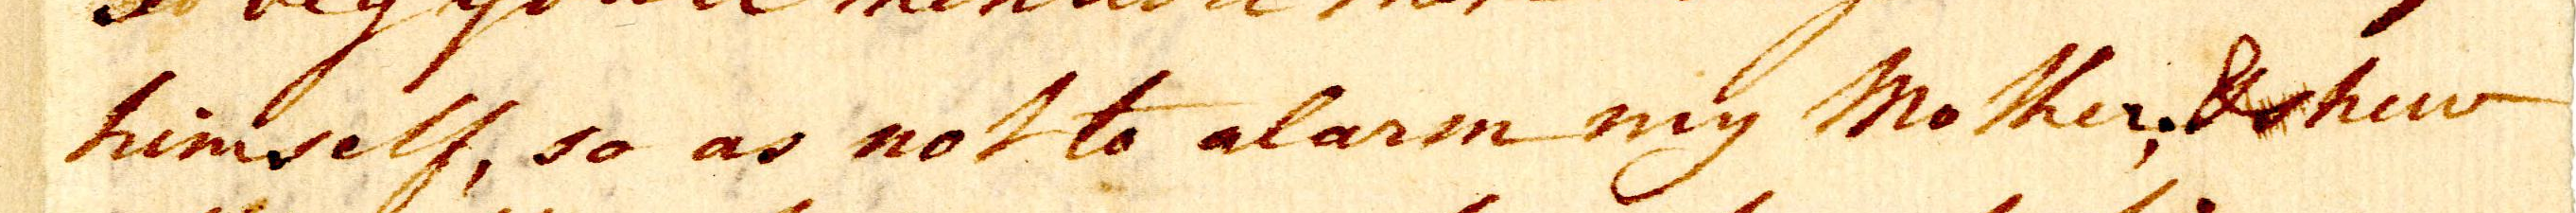himself, so as not to alarm my Mother; & shew
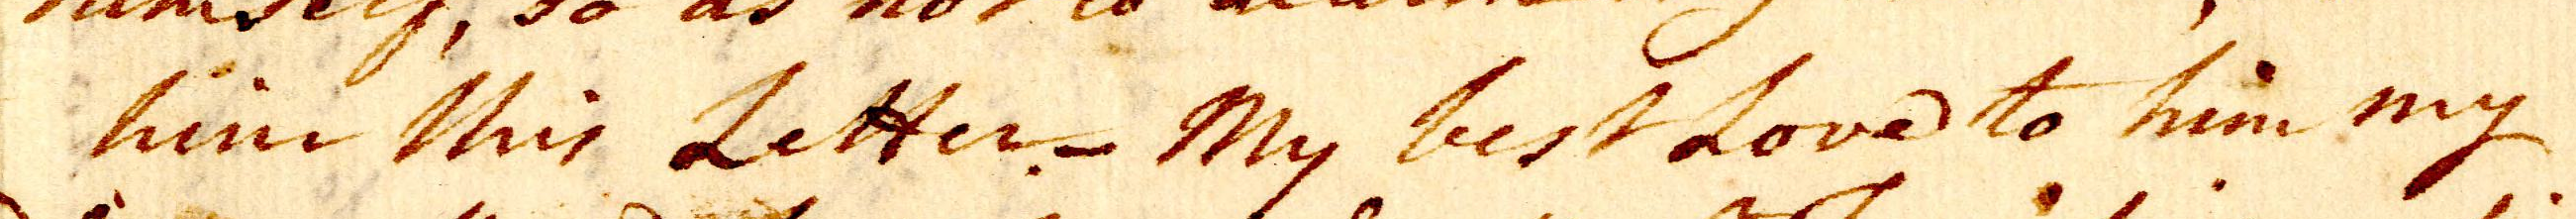him this Letter.- My best Love to him my
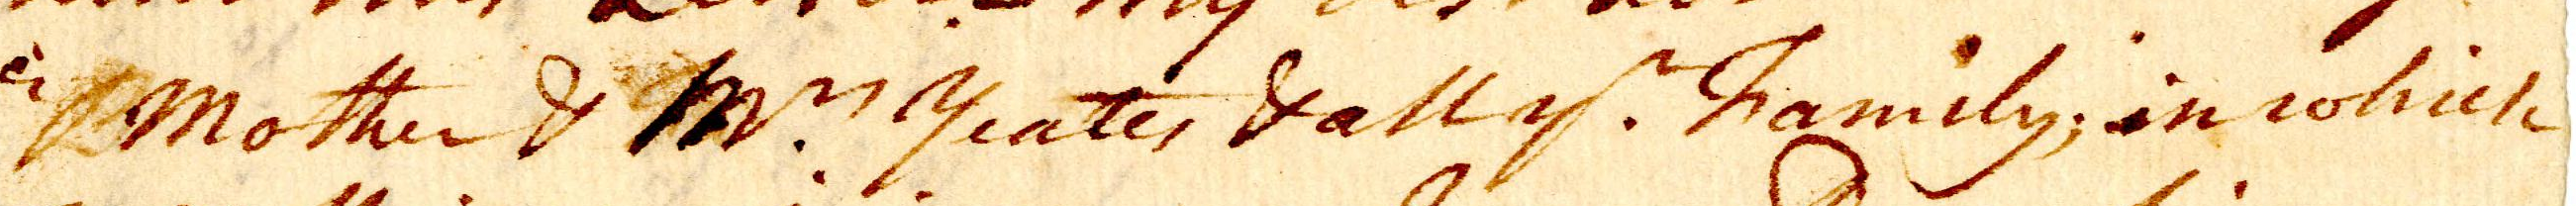Mother & M^rs. Yeates & all y^e. Family; in which
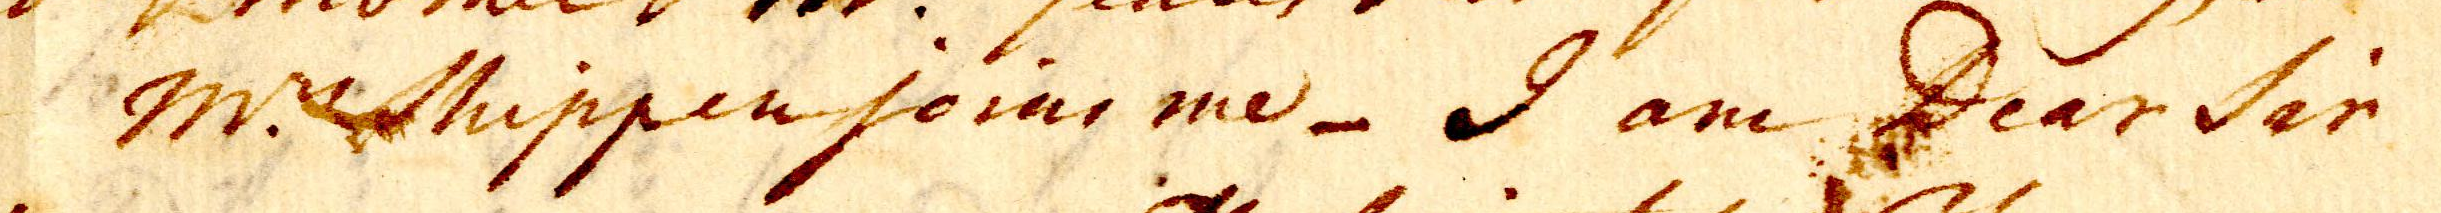M^rs. Shippen joins me- I am Dear Sir
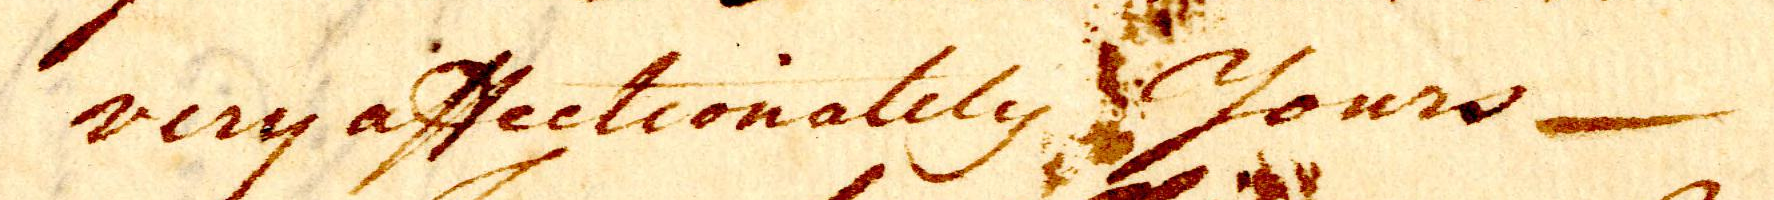very affectionately Yours-
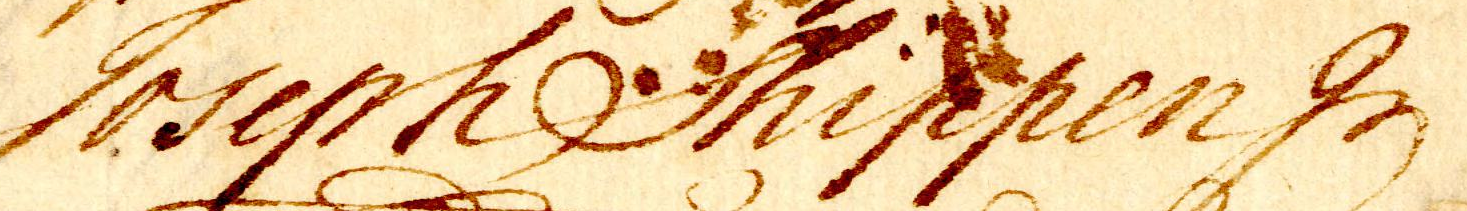Joseph Shippen Jr
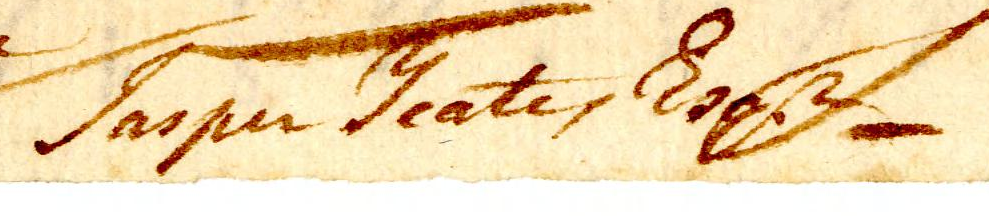Jasper Yeates Esq^r.-
